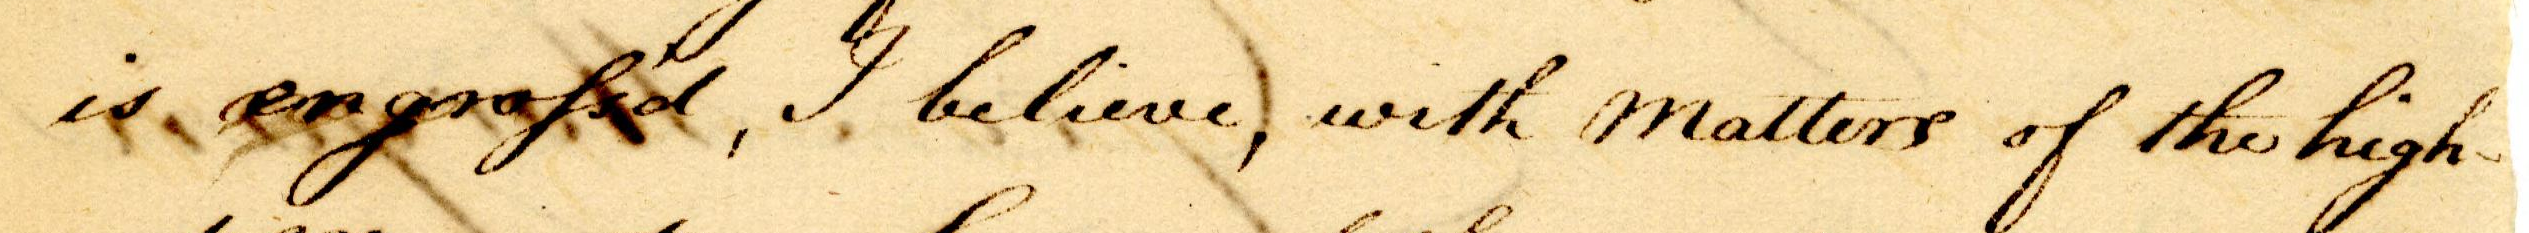is engrossed, I believe, with matters of the high-
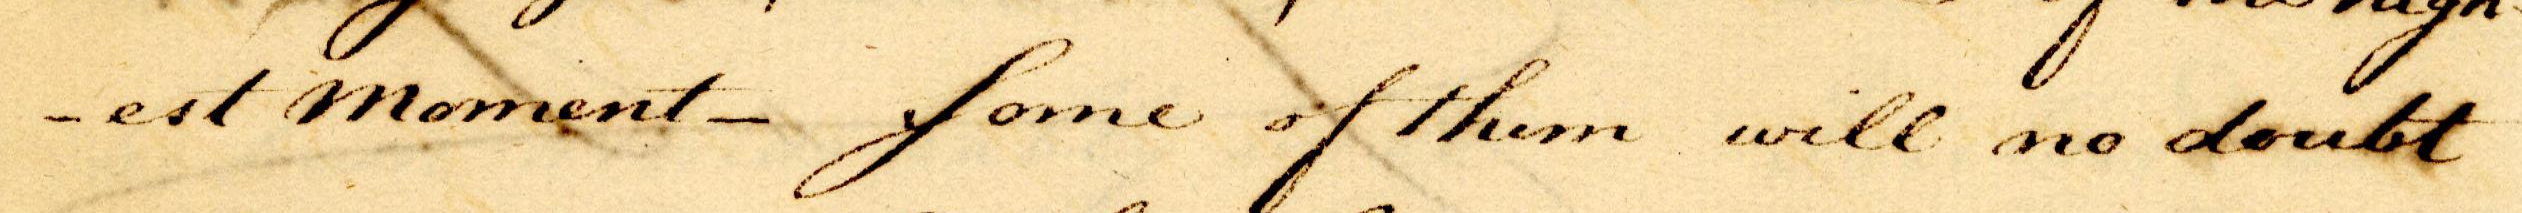-est moment- Some of them will no doubt
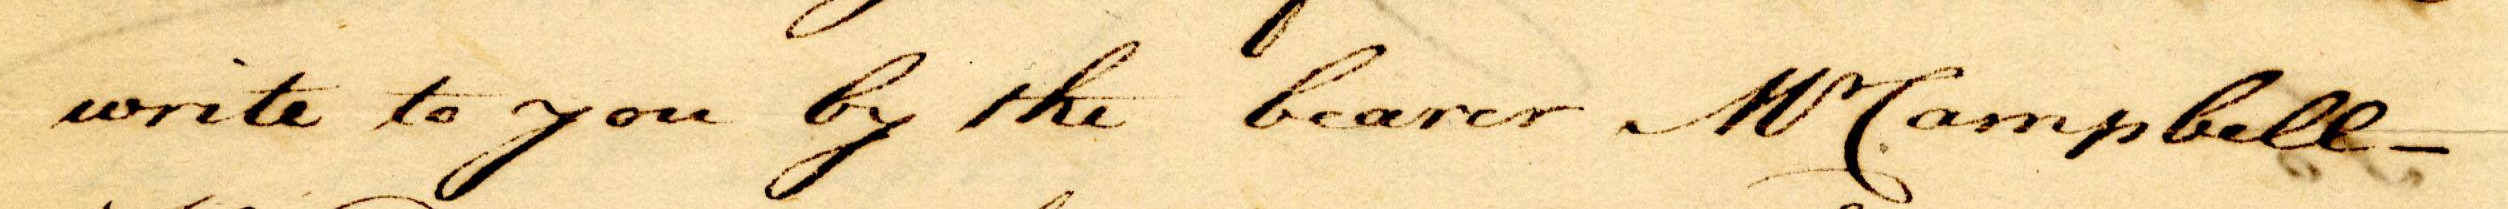write to you by the bearer M^r Campbell-
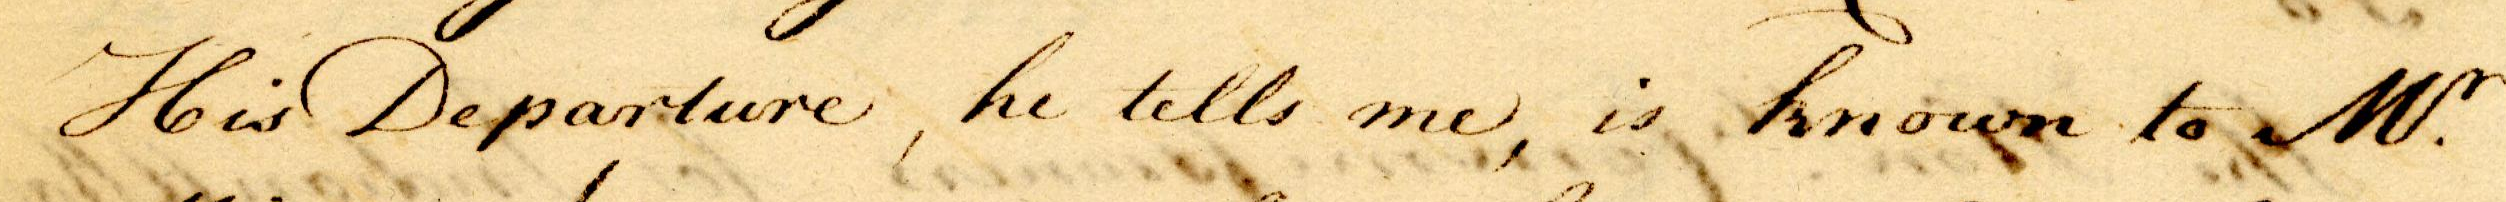His Departure, he tells me is known to M^r.
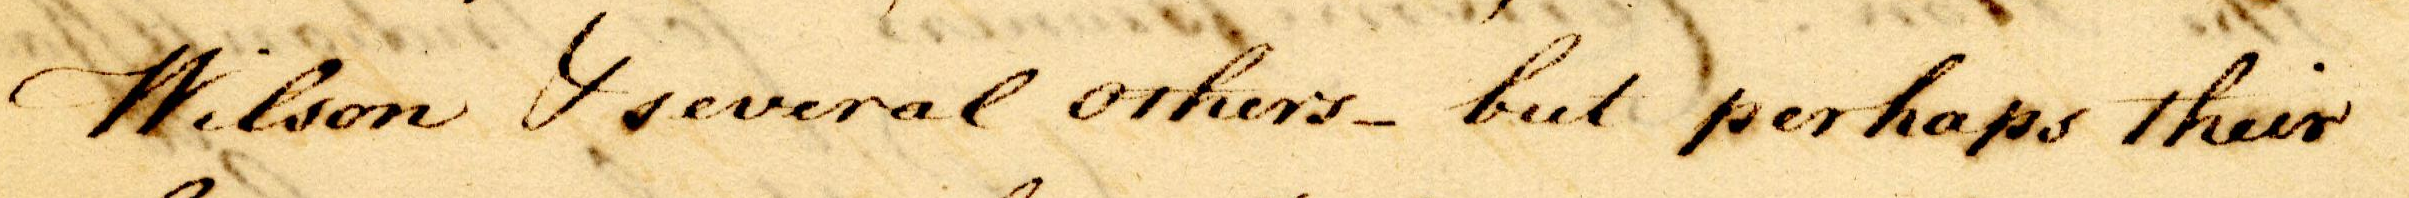Wilson & several others- but perhaps their
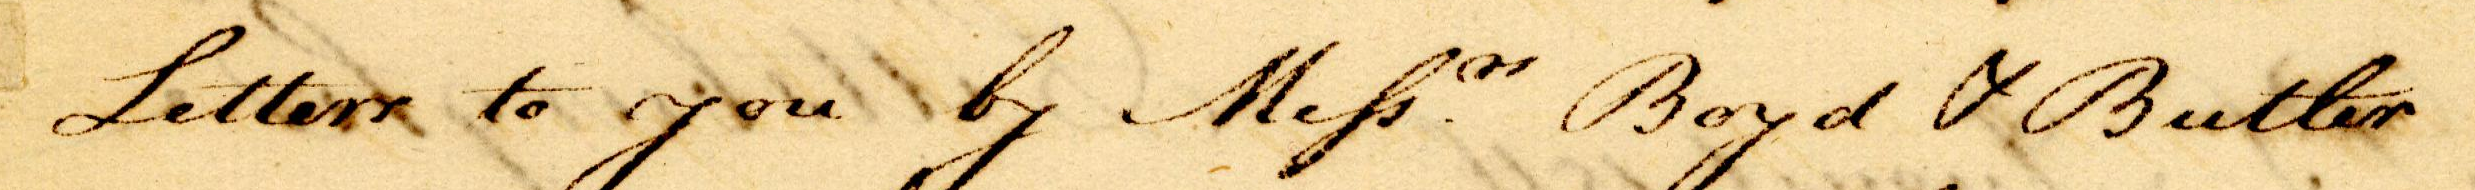Letters to you by Mess^rs. Boyd & Butler
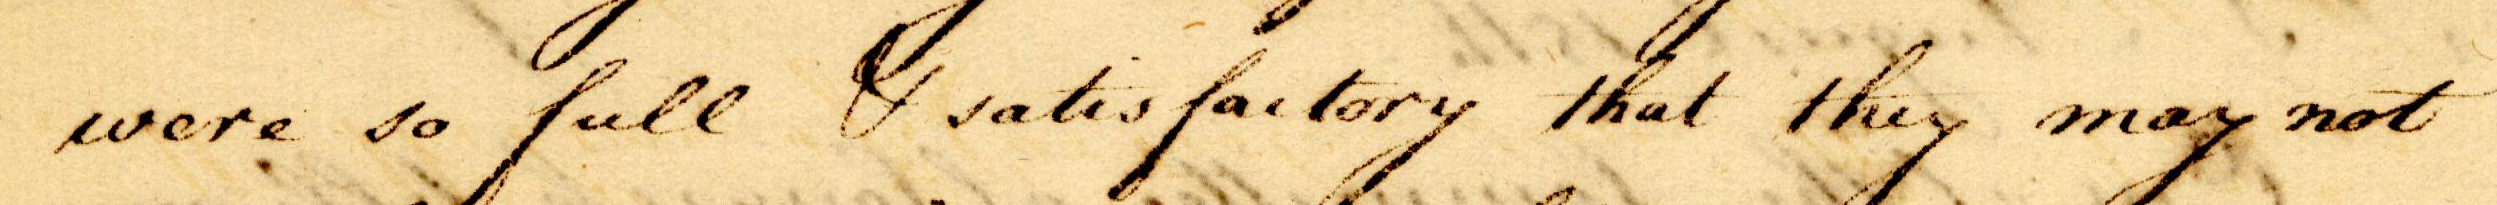were so full & satisfactory that they may not
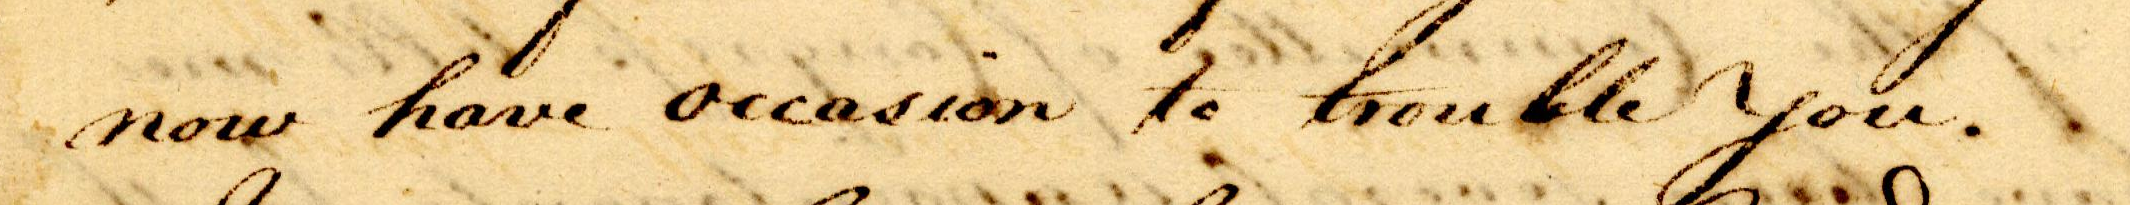now have occasion to trouble you.
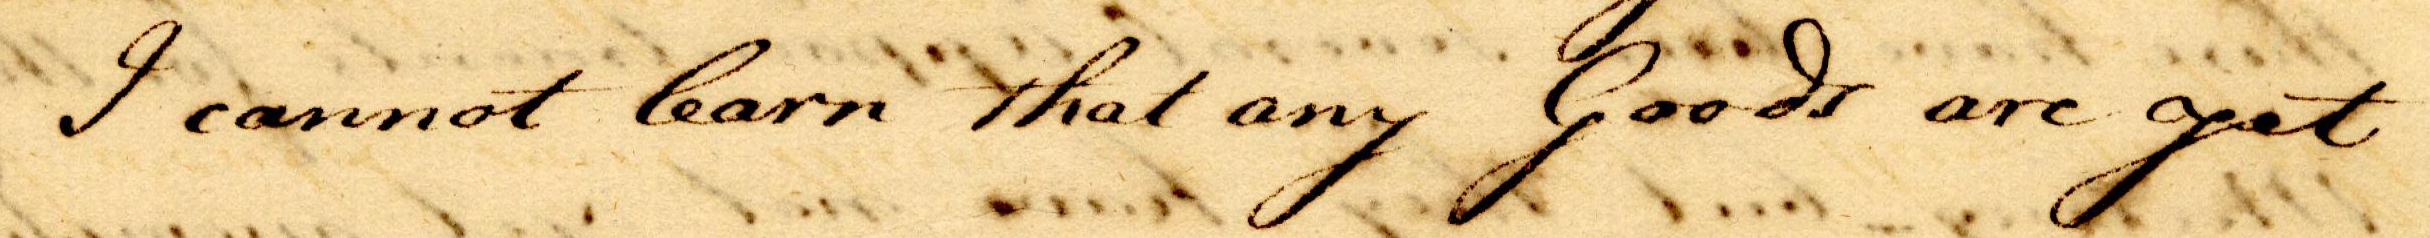I cannot learn that any Goods are yet
